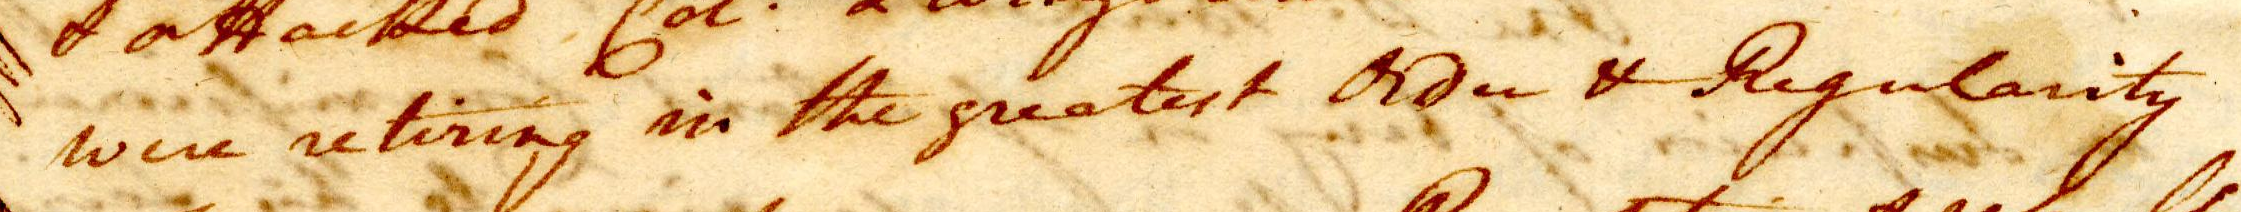were retiring in the greatest Order & Regularity
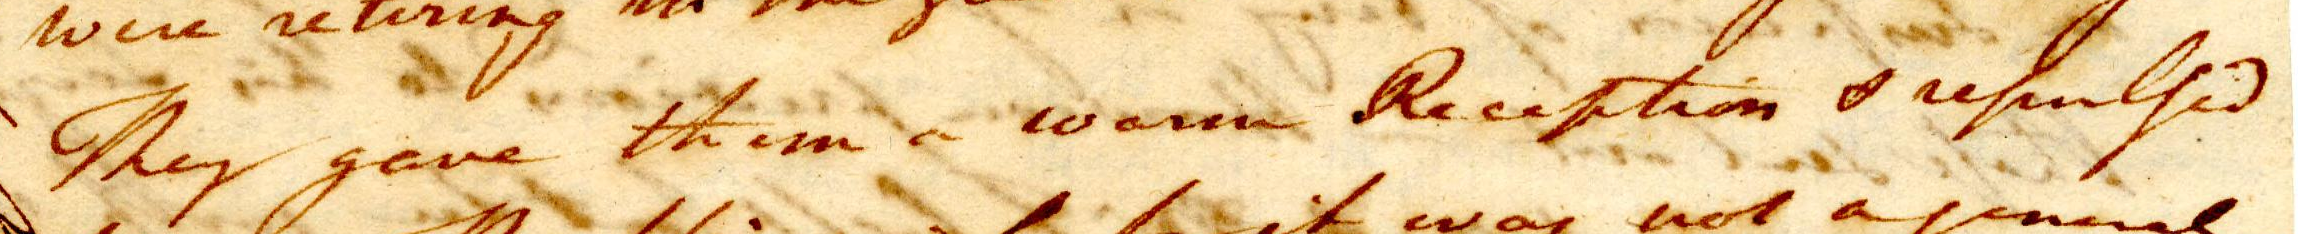They gave them a warm Reception & repulsed
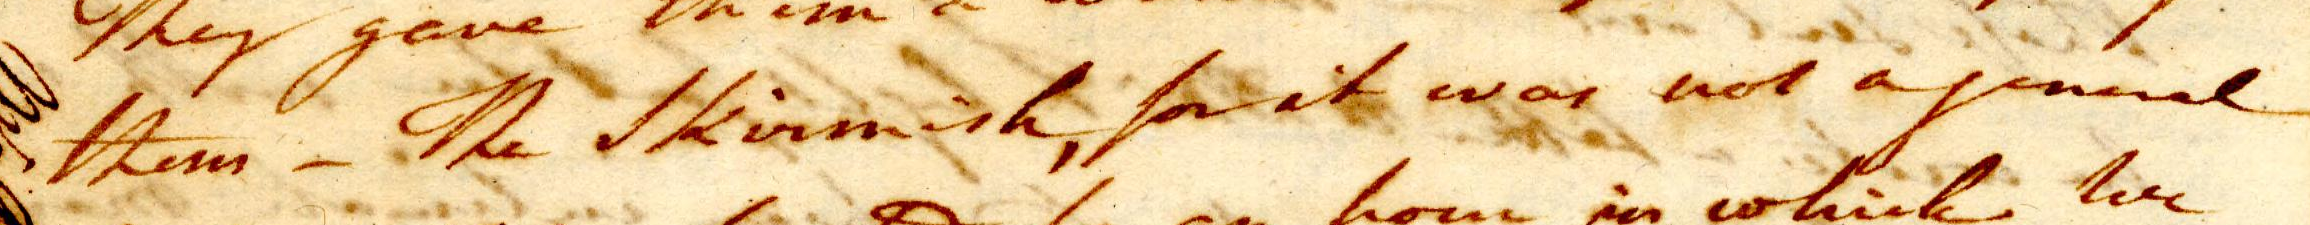them. The skirmish, for it was not a general
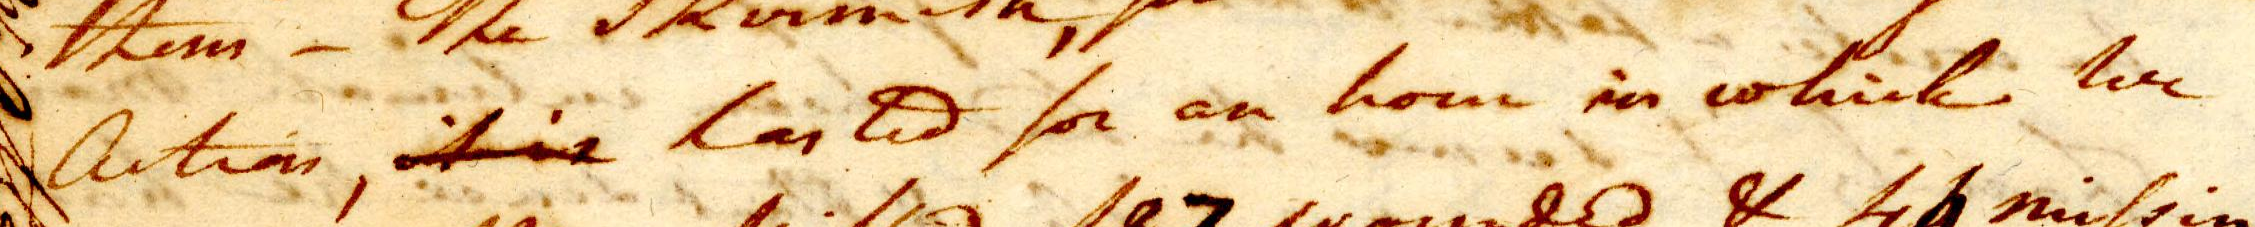Action, it is lasted for an hour in which We
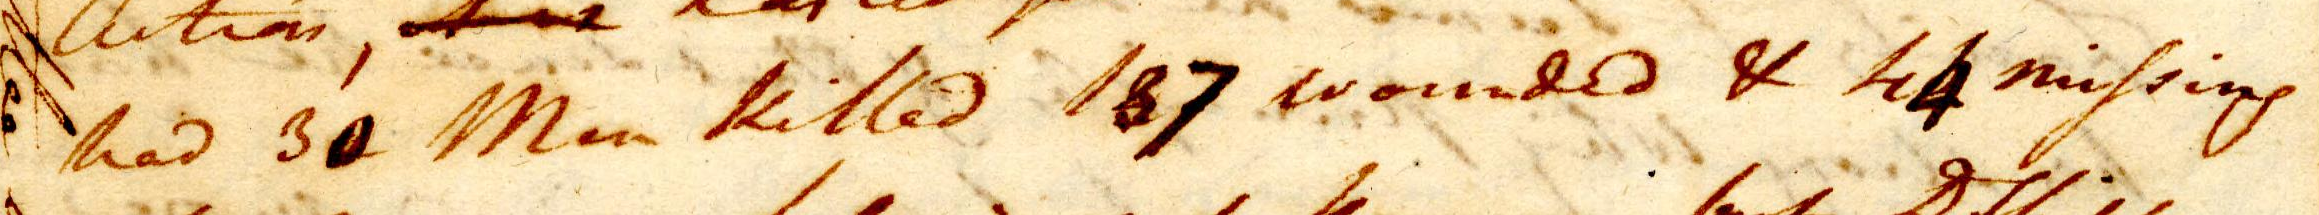had 30 Men Killed 187 wounded & 44 missing
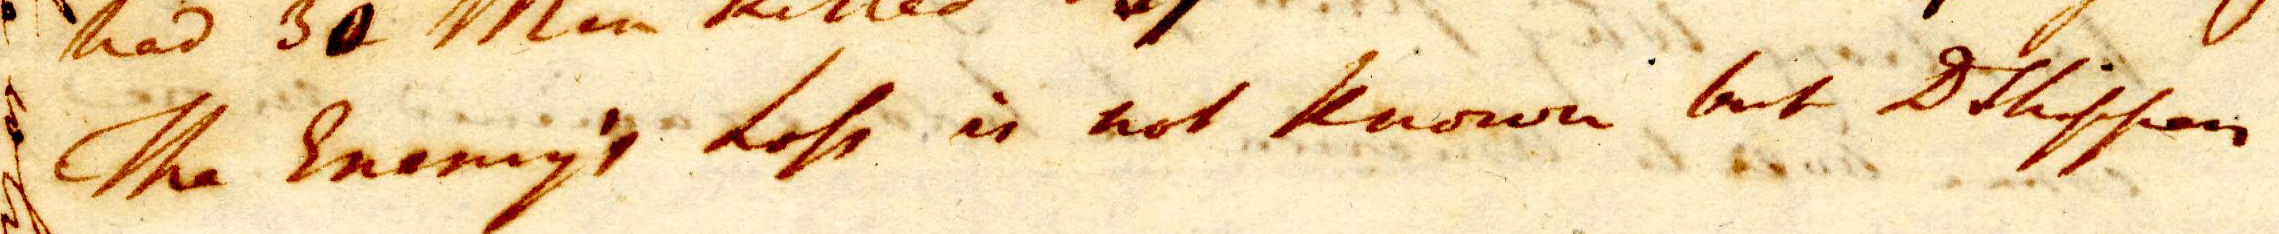The Enemy's Loss is not known but D. Shippen
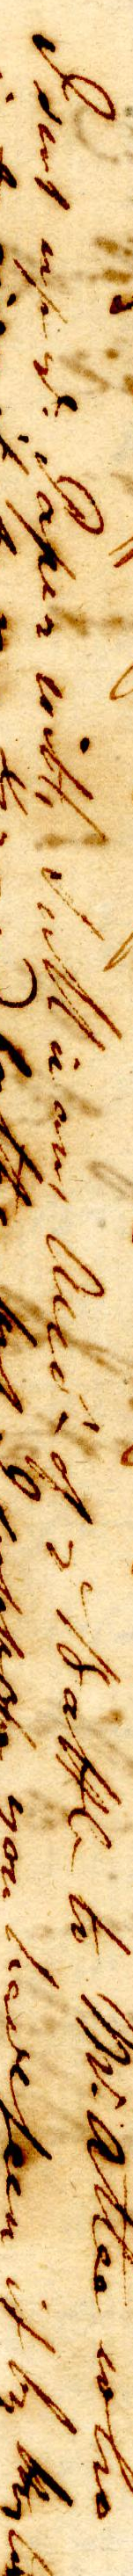I sent up y^e Paper with Sullivans Acco^t of y^e Battle to M^r Attea who
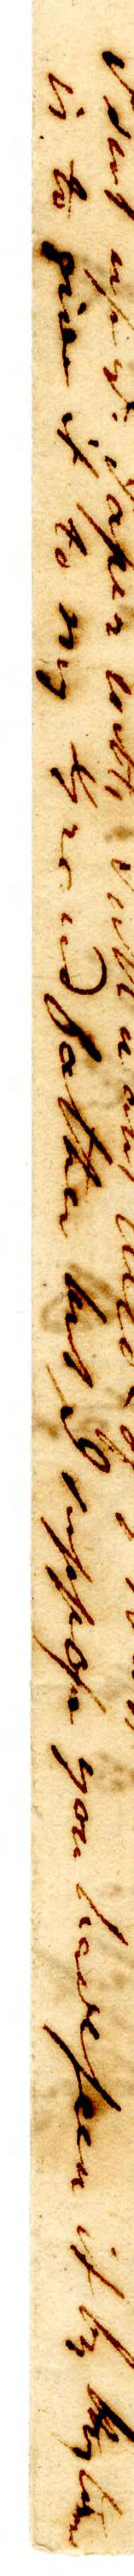is to price it to my Grand father but I suppose you have seen it by the time
